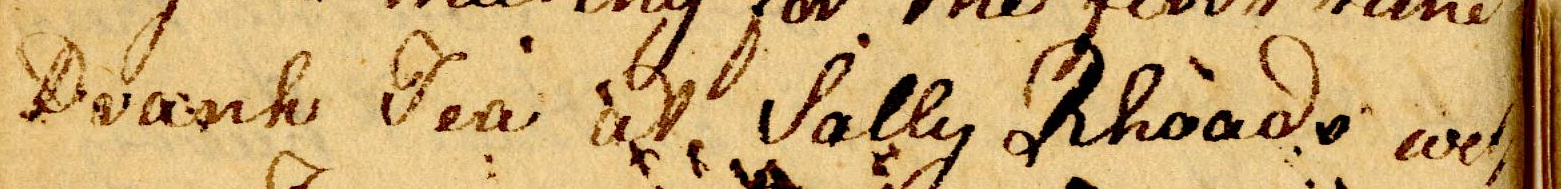Drank Tea at Sally Rhoads we
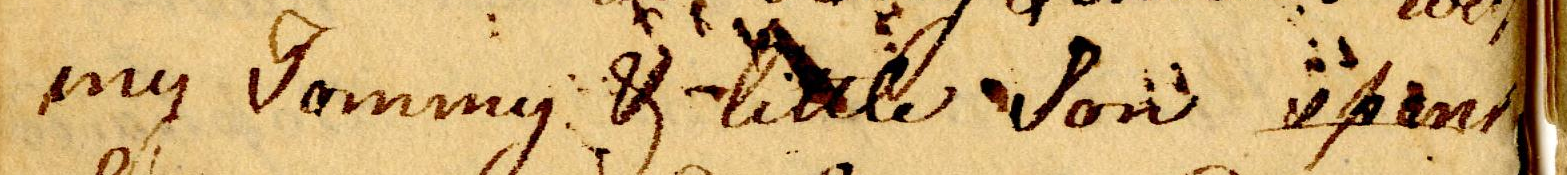my Tommy & little Son spent
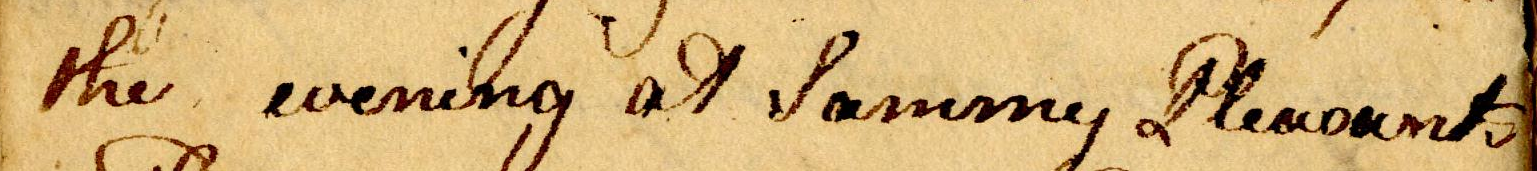the evening at Sammy Pleasants
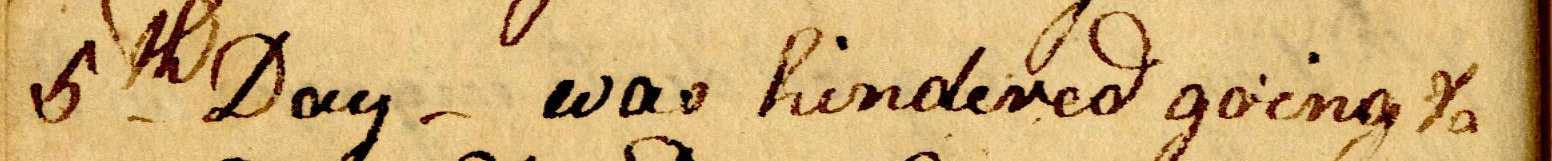5^th Day- was hindered going to
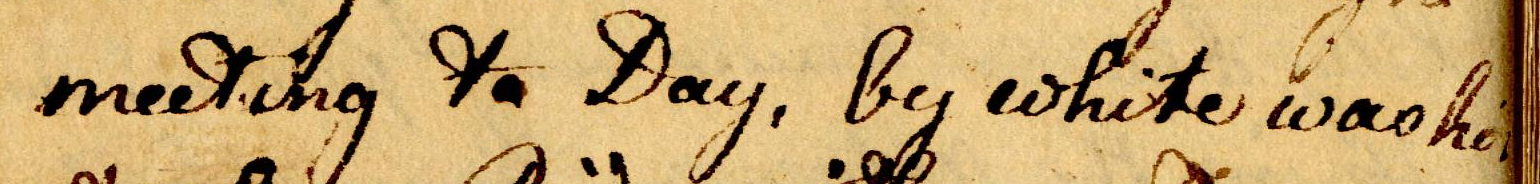meeting to Day, by white washin
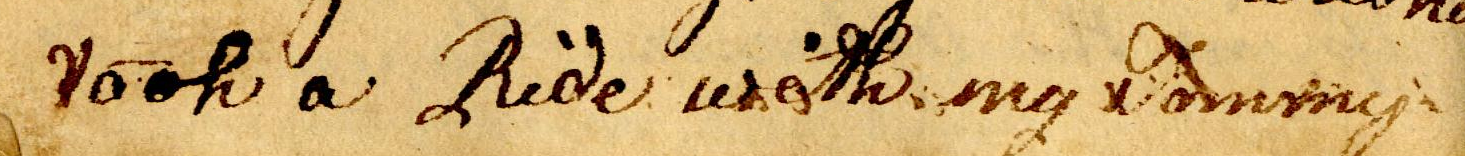took a Ride with my Tommy
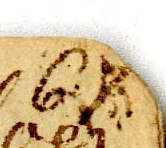67
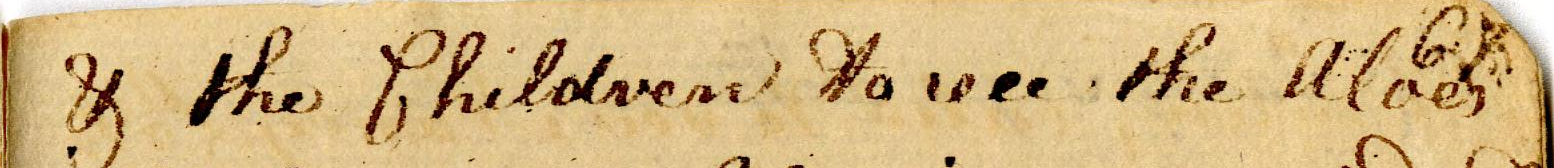& the Children to see the Aloes
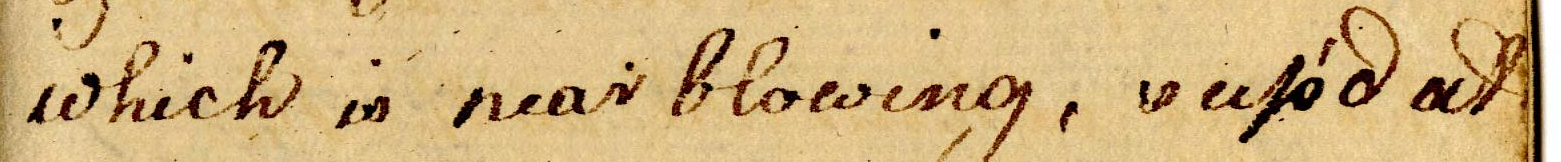which is near blowing, sup'd at
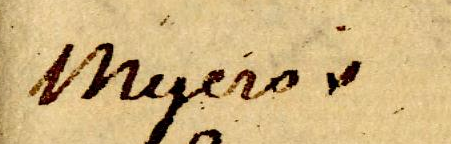Myers's
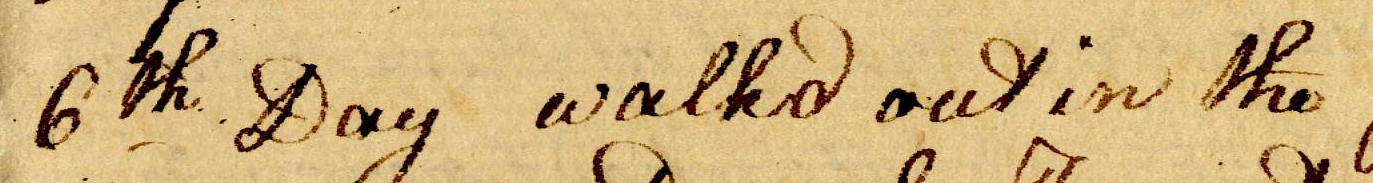6^th. Day walkd out in the
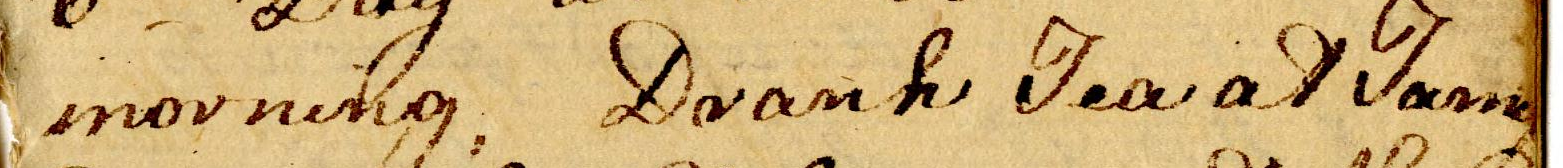morning. Drank Tea at Tamy
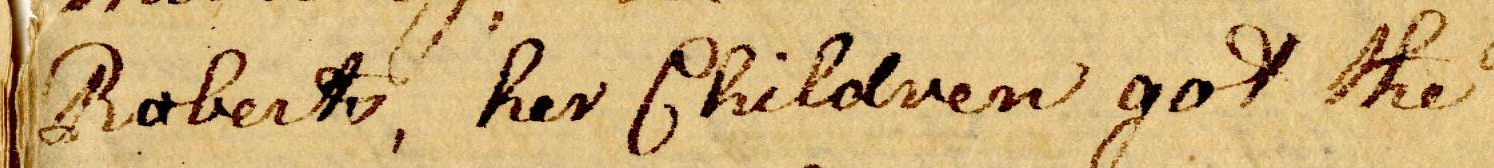Roberts, her Children got the
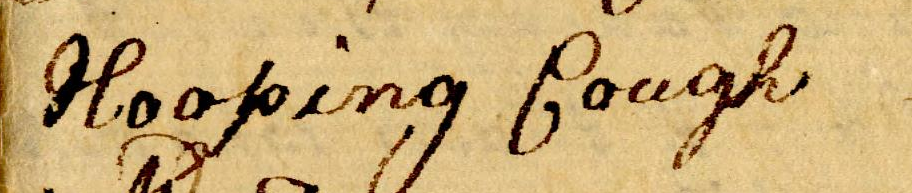Hooping Cough
